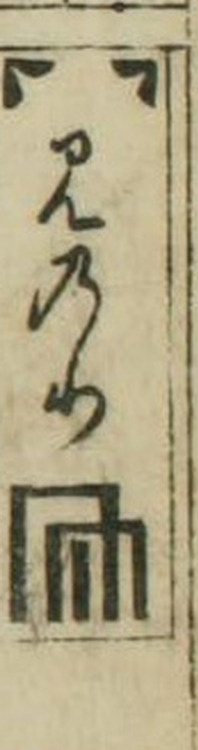みのり
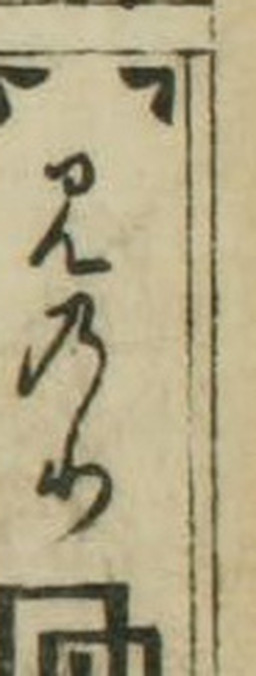みのり
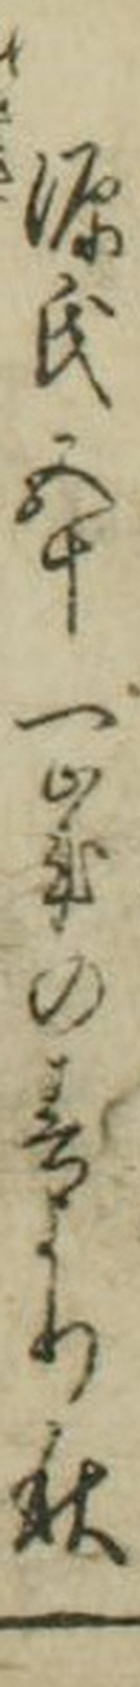源氏五十一歳の春より秋
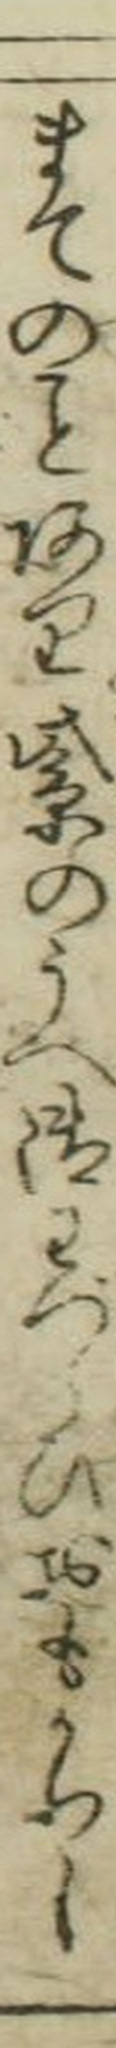まてのことあり。紫のうへ御わづらひおもかりし
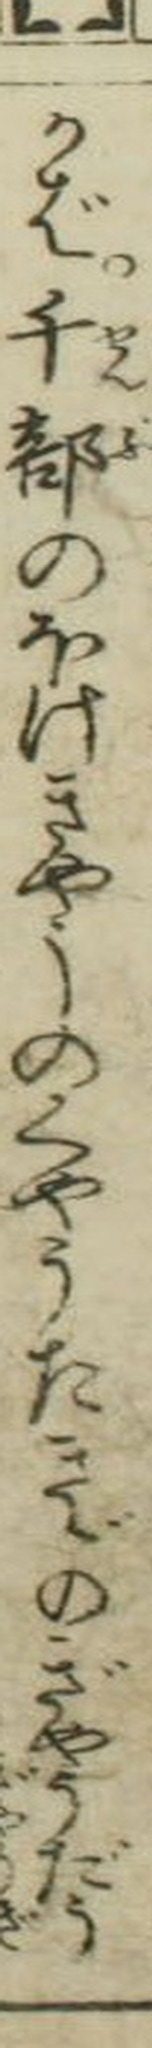かば。千部のほけきやうのくやうたきゞのぎやうだう
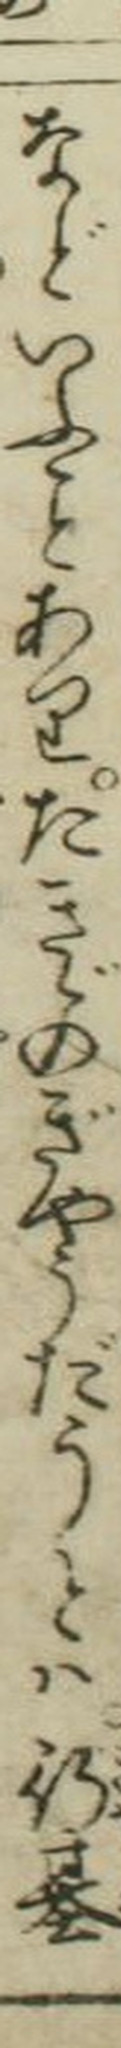などいふことあり。たきゞのぎやうだうとは。行基
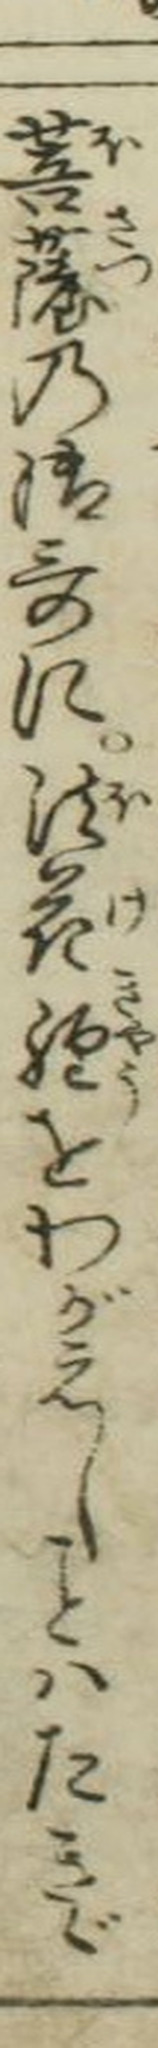菩薩の御哥に。法花経をわがえしことはたきゞ
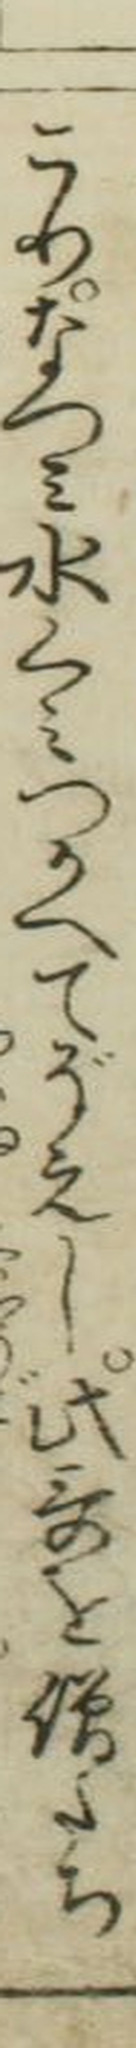こり。なつみ水くみつかへてぞえし。此哥を僧たち
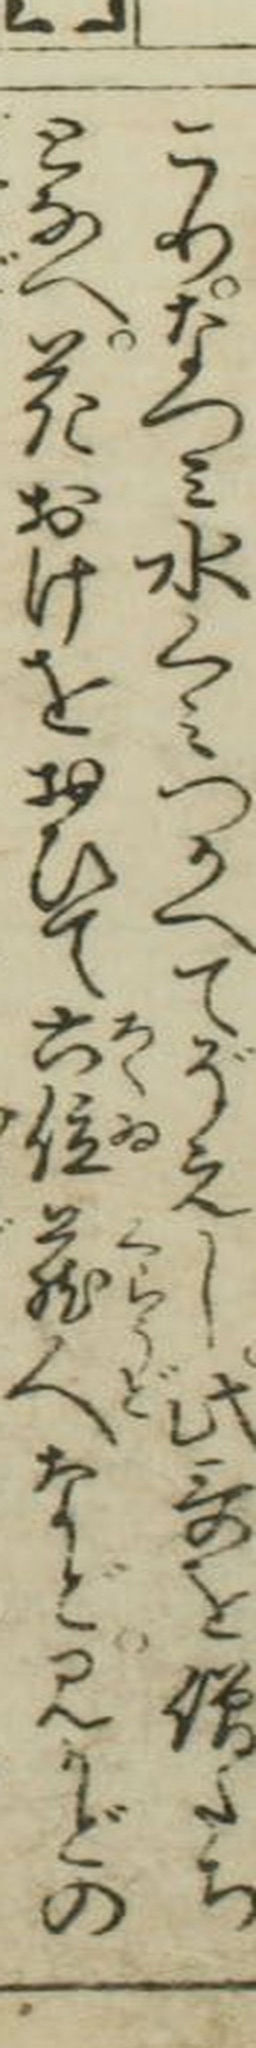となへ。花おけをおひて六位蔵人など。みかどの
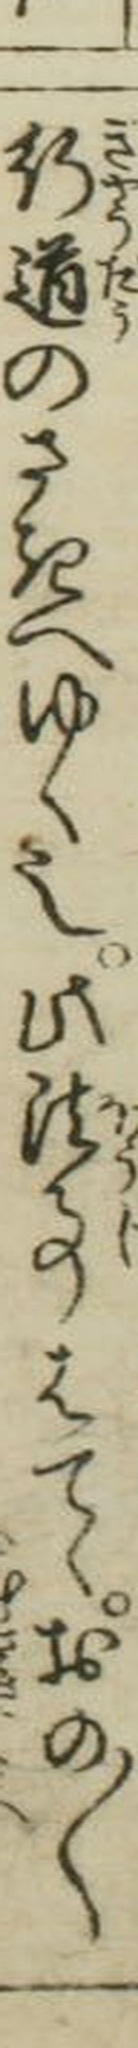行道のさきへゆく也。此法事はてゝ。おの〳〵
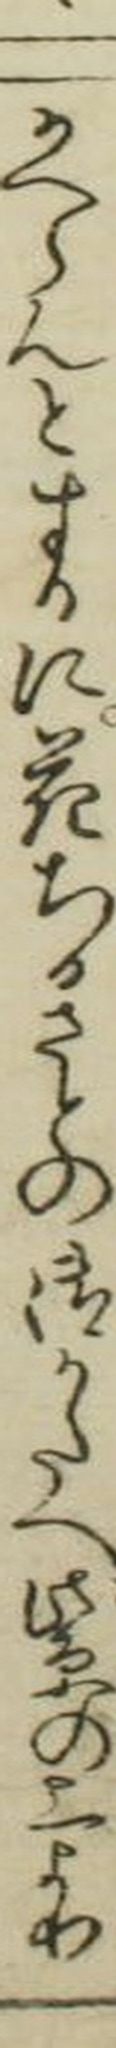かへらんとするに。花ちるさとの御かたへ。紫の上より
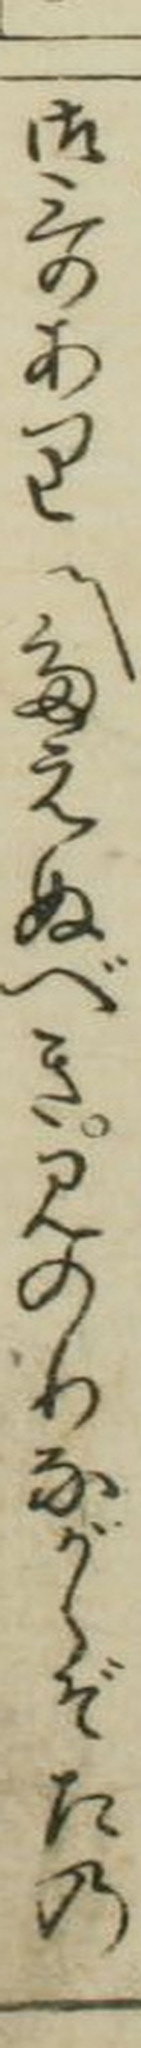御哥あり〽たえぬべき。みのりながらぞたの
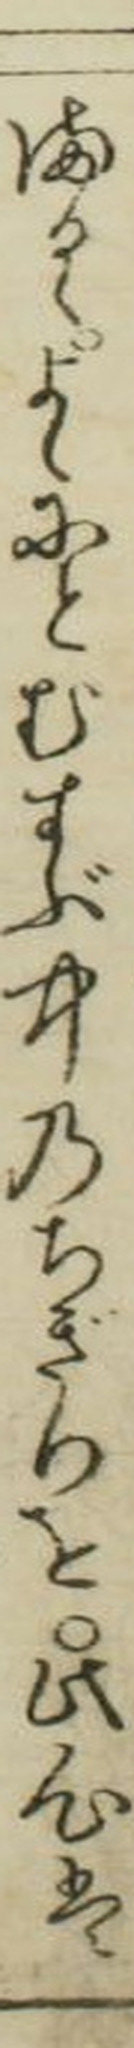まるゝ。よゝにとむすぶ中のちぎりを◯此心は
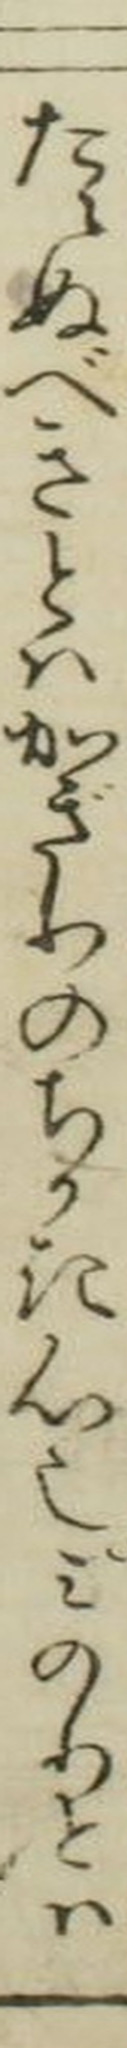たえぬべきとはかぎりのちかき心也。みのりとは
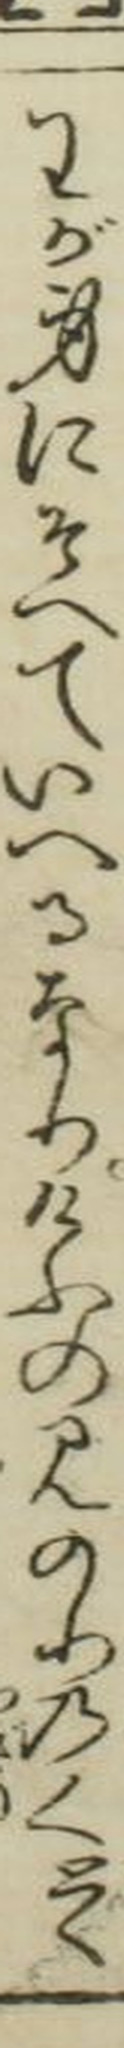わが身にそへていへるなり。けふのみのりのくどく
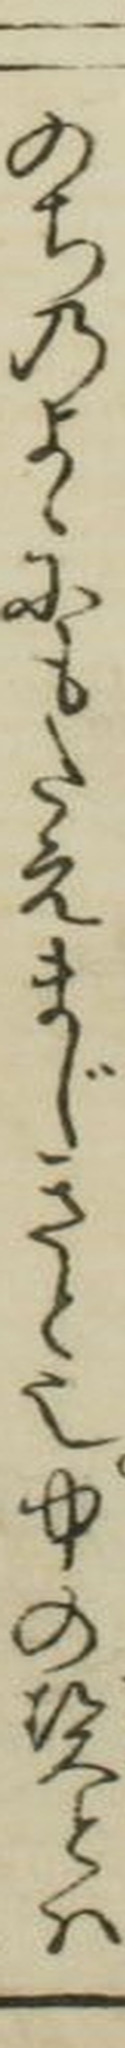のちのよゝにもたえまじきと也。中の契とは
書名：女源氏教訓鑑
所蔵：東京学芸大学附属図書館
